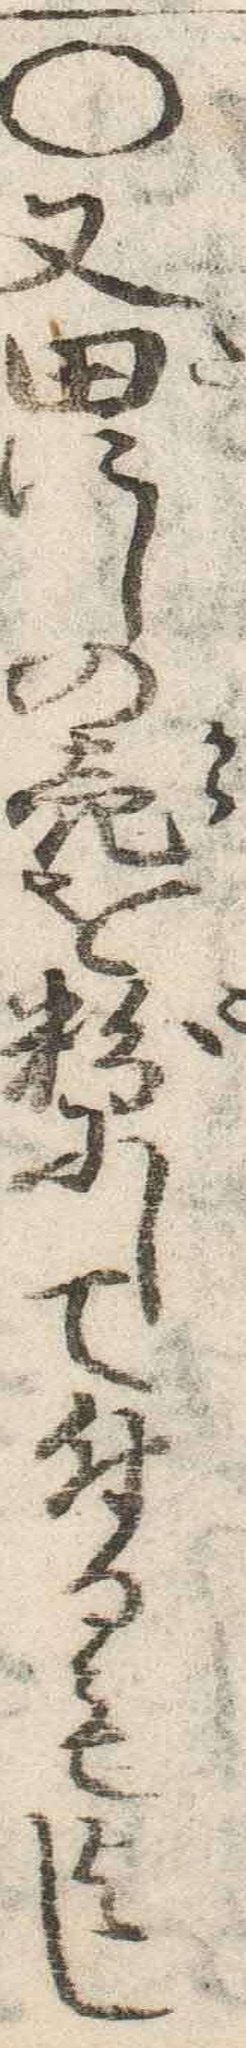○又田にしの殻を粉にして付るもよし
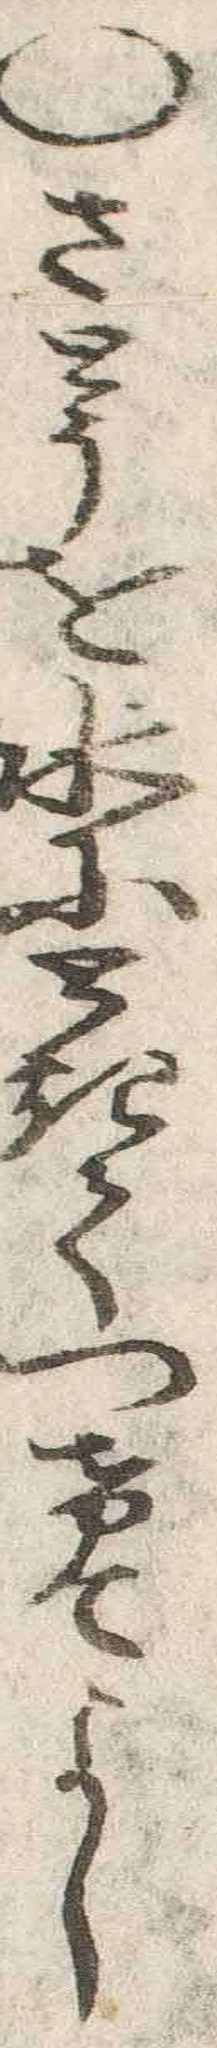○さとうを水にときてつけてよし
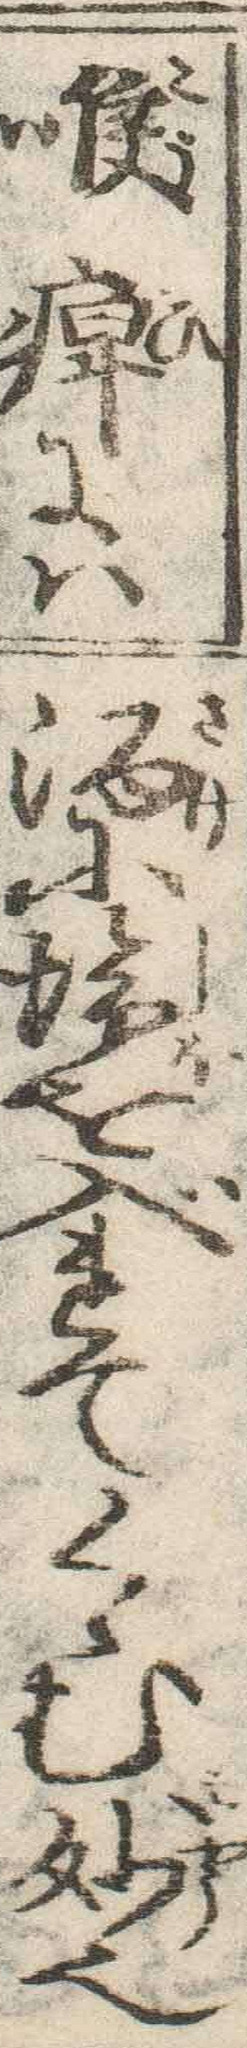喉痺には酒に塩を入れてくゝむ妙也
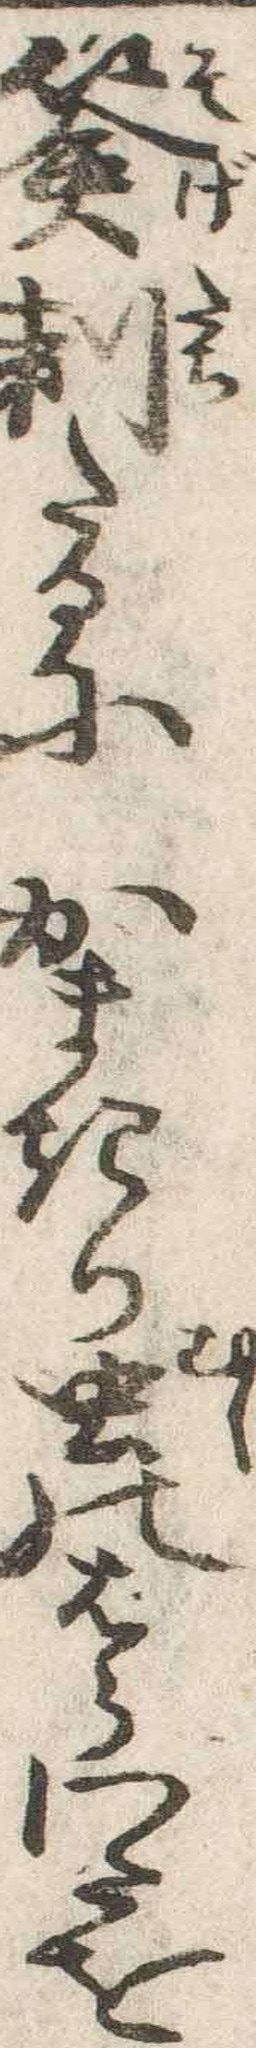簽刺たるにかまきり虫のはらわたをそげ
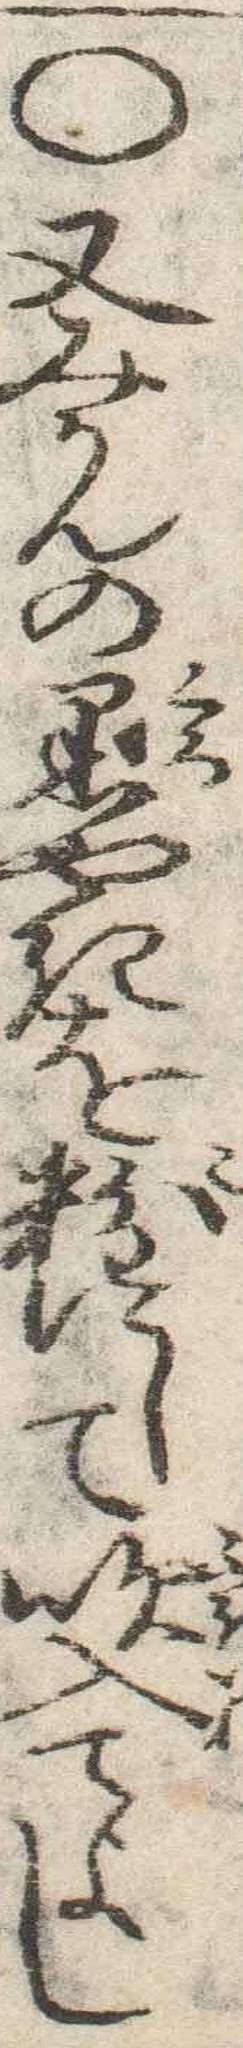○又みかんの黒やきを粉にして吹入てよし
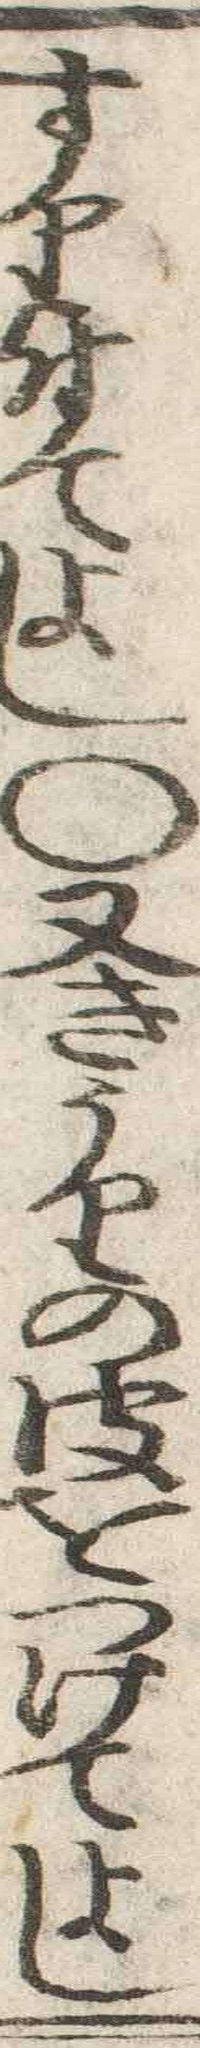すり付てよし○又きうりの皮をつけてよし
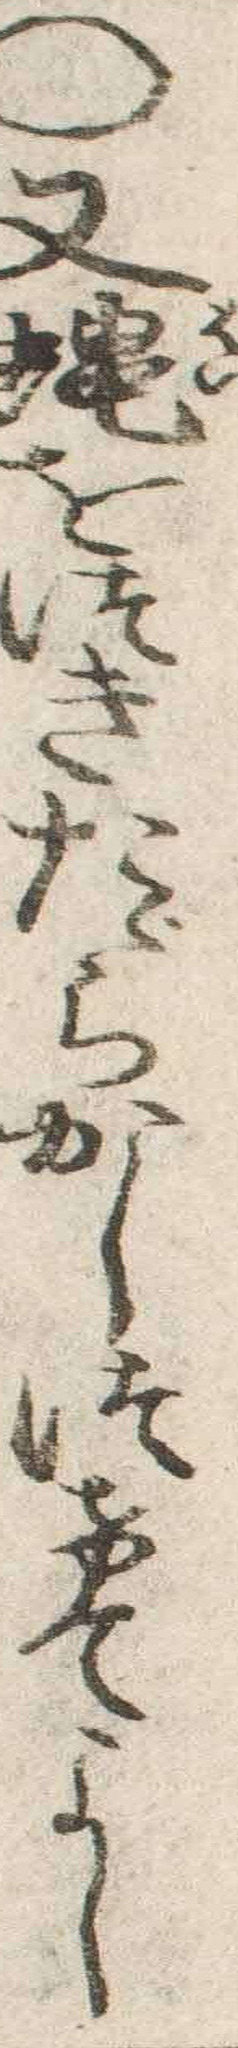○又蝿をつきたゞらかしつけてよし
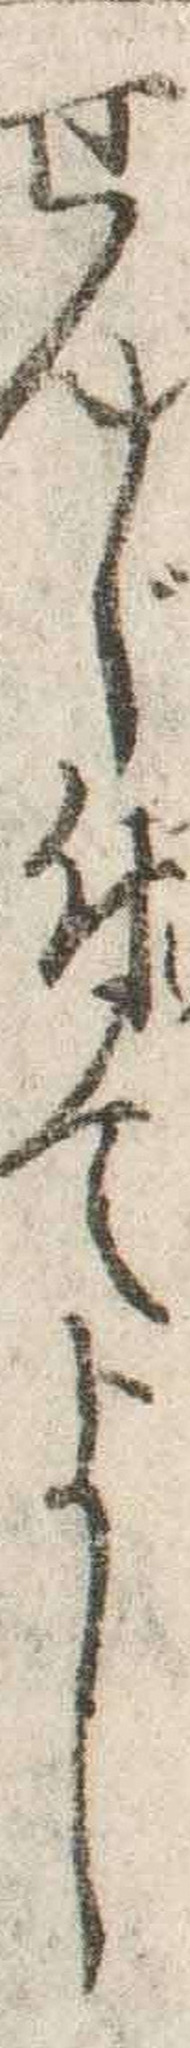せんじ付てよし
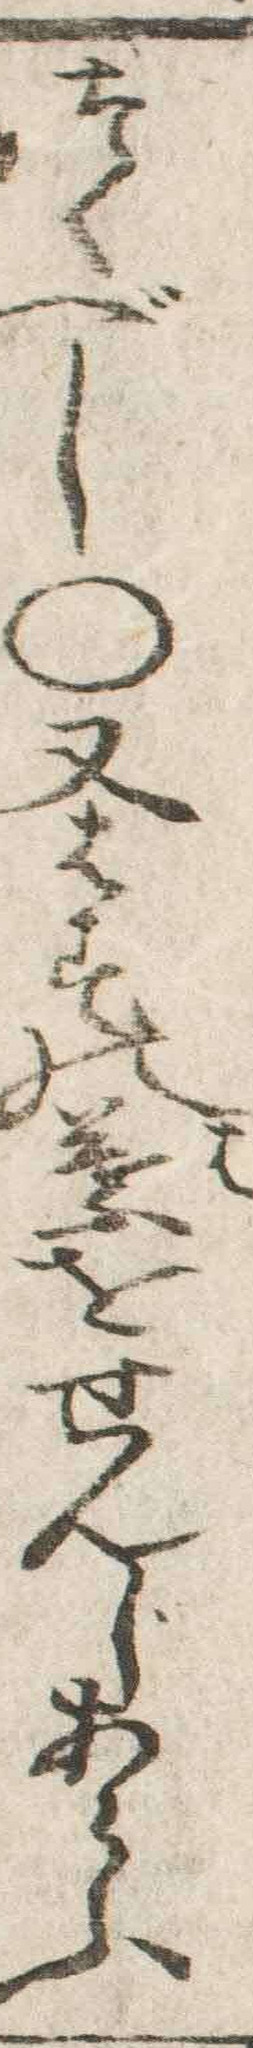つくべし○又はすの葉をせんじあらふ
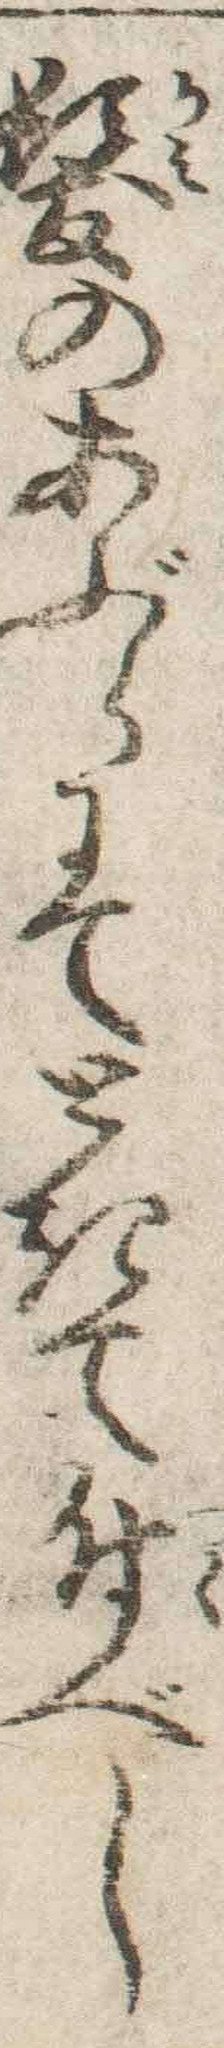髪のあぶらにてときて付べし
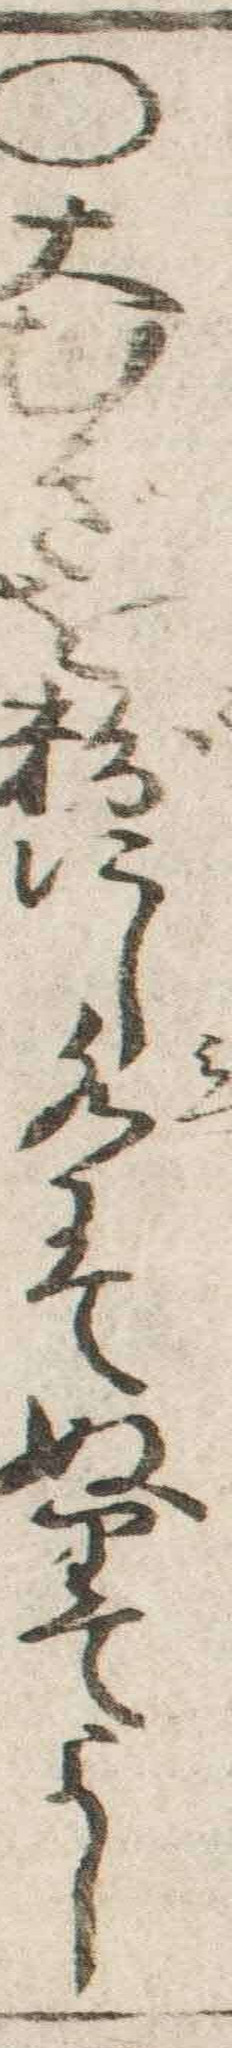○大むぎを粉にし水にてぬりてよし
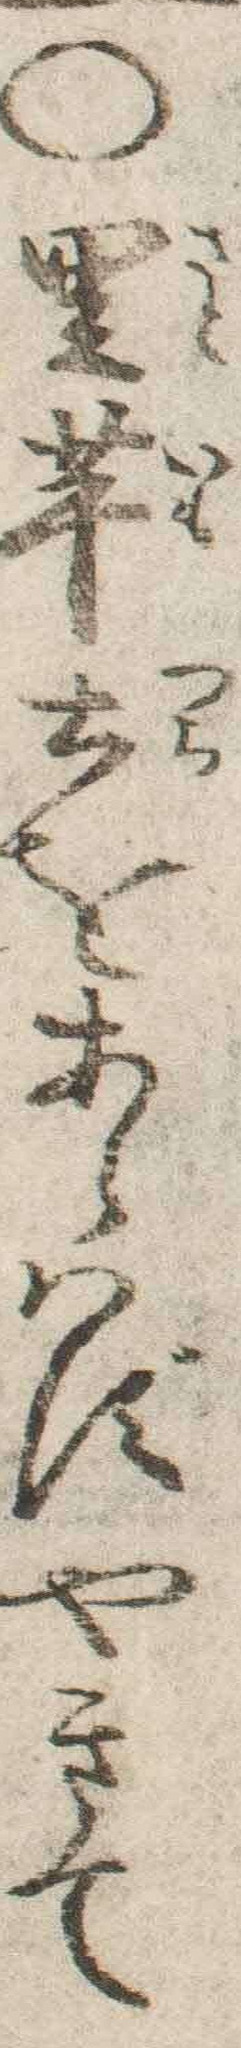○里芋土をあらはずやきて
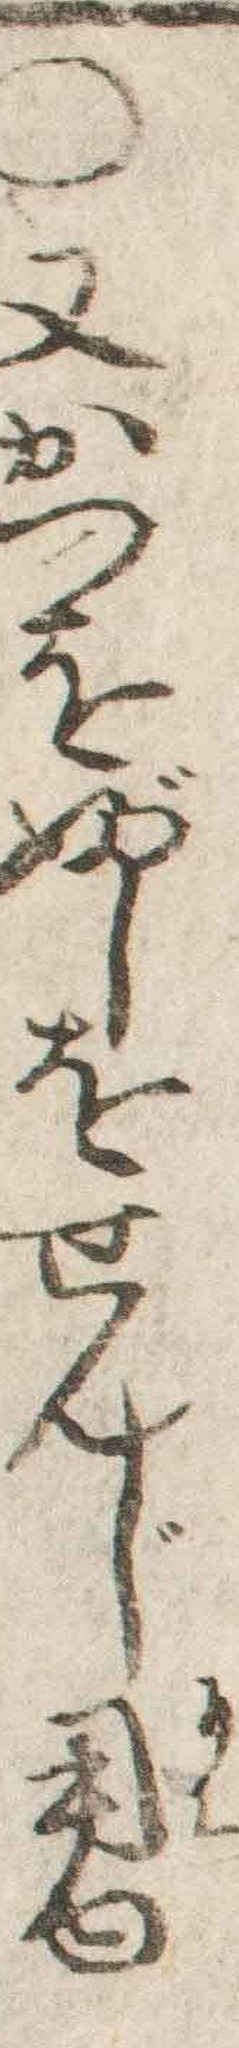○又かつをぶしをせんじ用ゆ
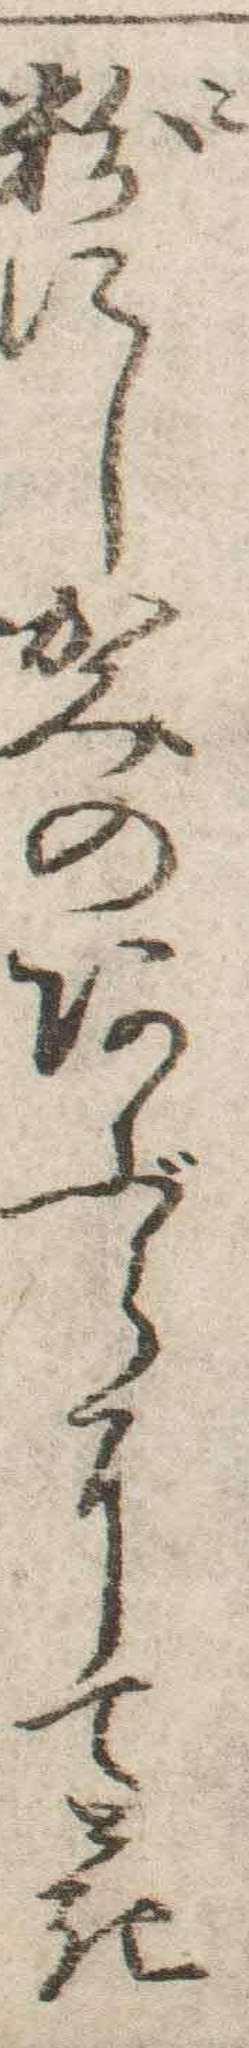粉にしかみのあぶらにてとき
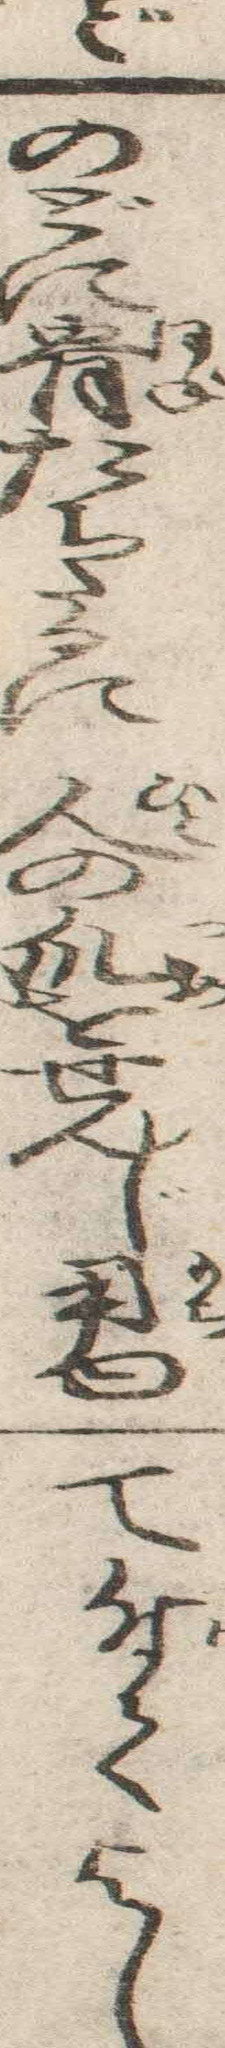のどに骨たちたるに人の爪をせんじ用ゆのど
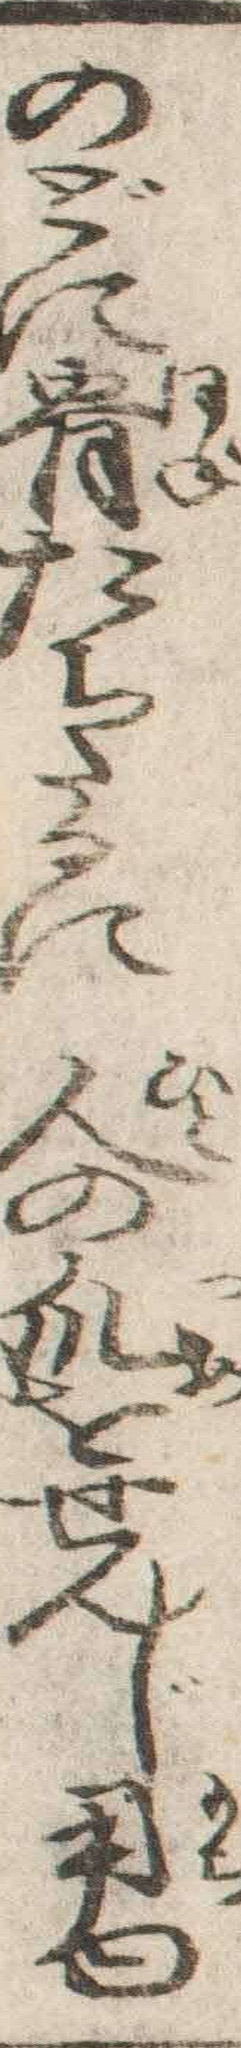のどに骨たちたるに人の爪をせんじ用ゆのど
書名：撫育草
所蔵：東京学芸大学附属図書館 国文学研究資料館
